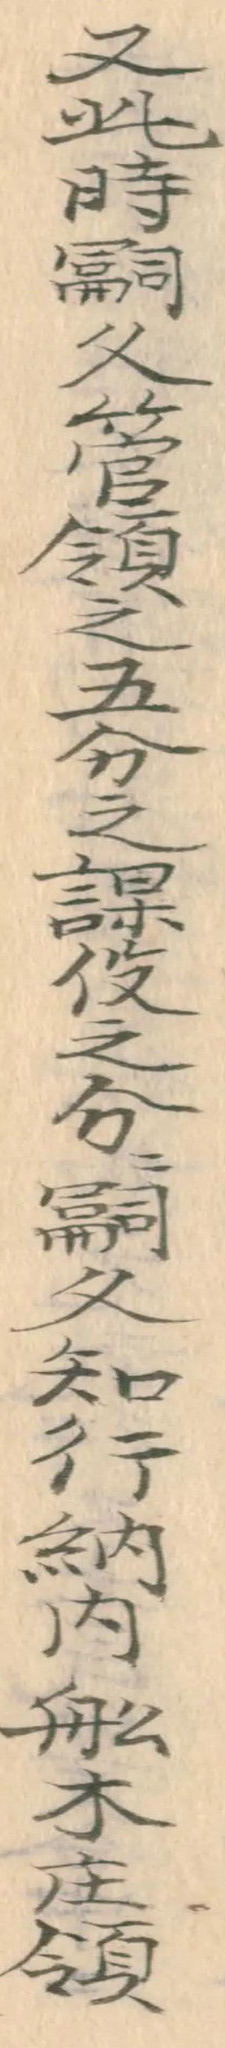又此時嗣久管領之五分之課役之分ニ嗣久知行納内船木庄領
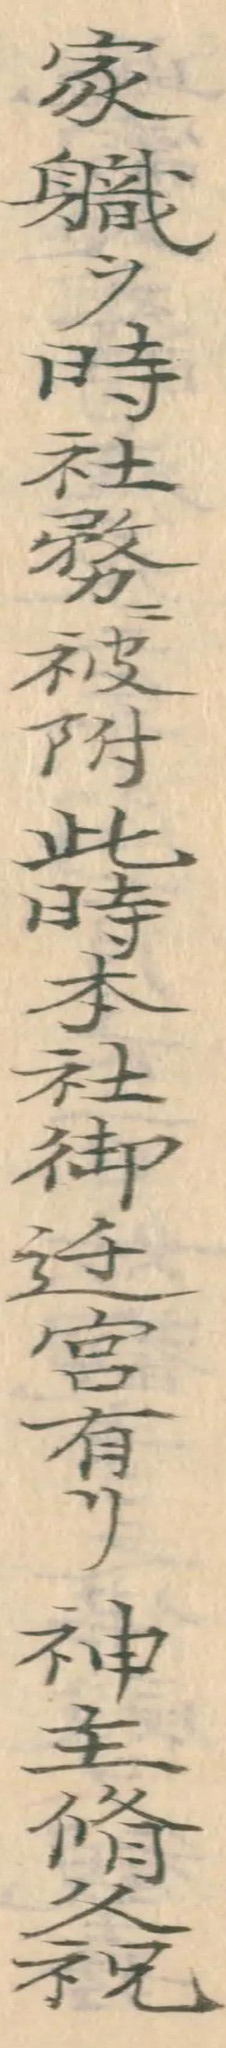家職ヲ時社務ニ被附此時本社御遷宮有リ神主脩久祝
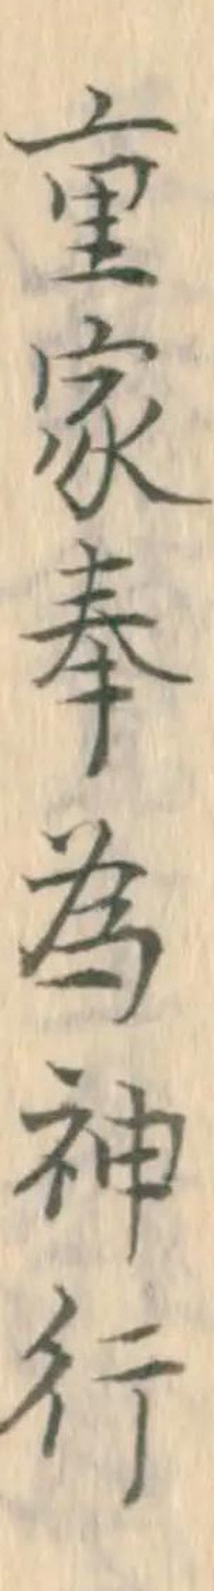重家奉為神行
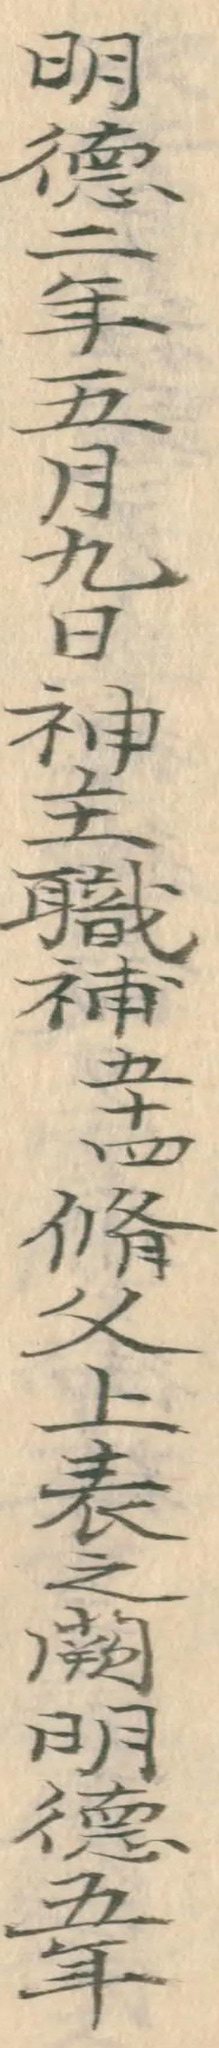明徳二年五月九日神主職補五十四脩久上表之闕明徳五年
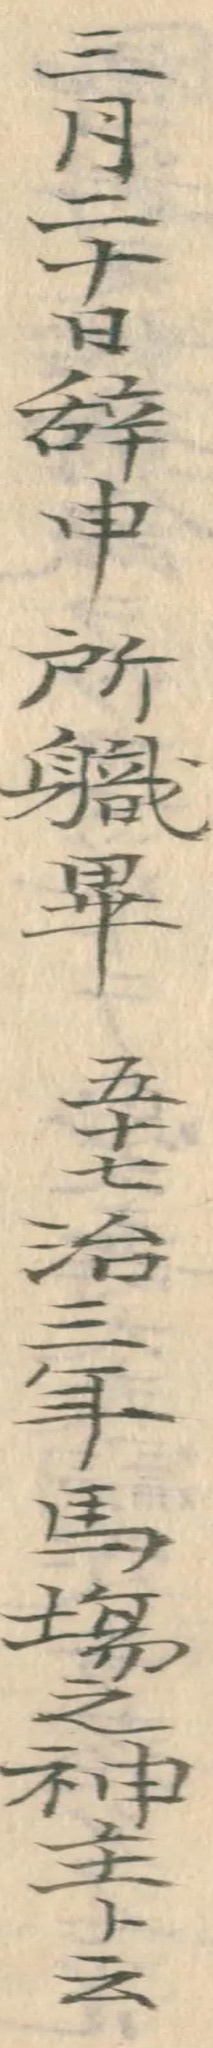三月二十日辞申所職畢五十七治三年馬場之神主ト云
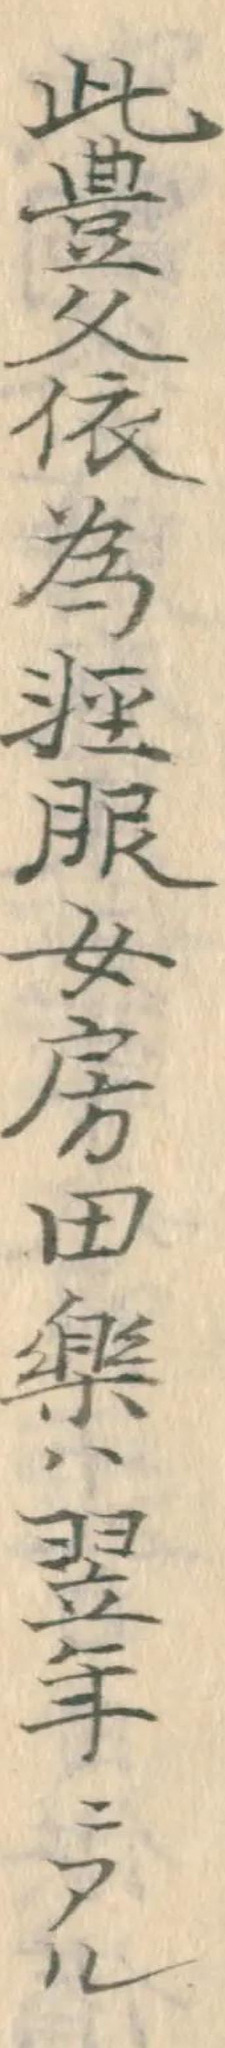此豊久依為軽服女房田楽ハ翌年ニアル
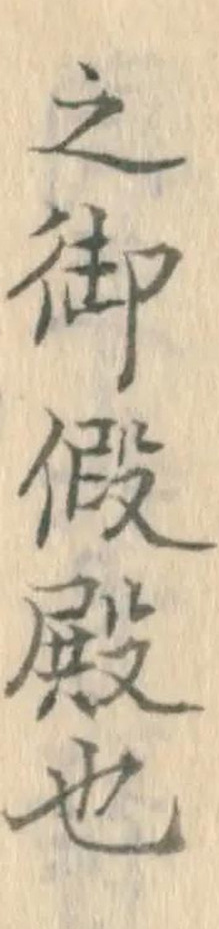之御仮殿也
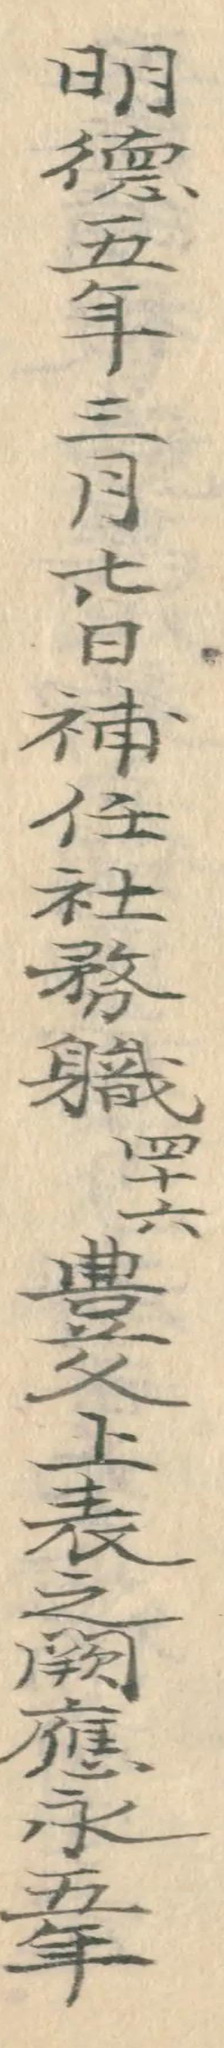明徳五年三月廿日補任社務職四十六豊久上表之闕応永五年
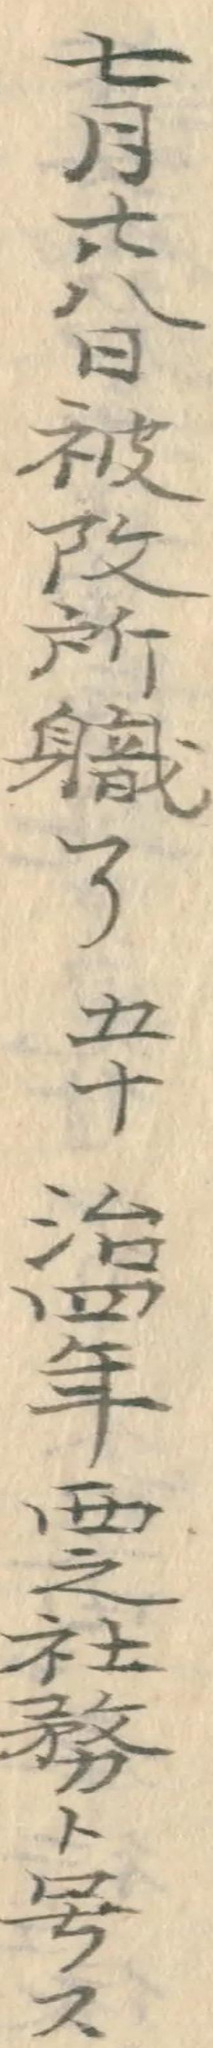七月廿八日被改所職了五十治四年西之社務ト号ス
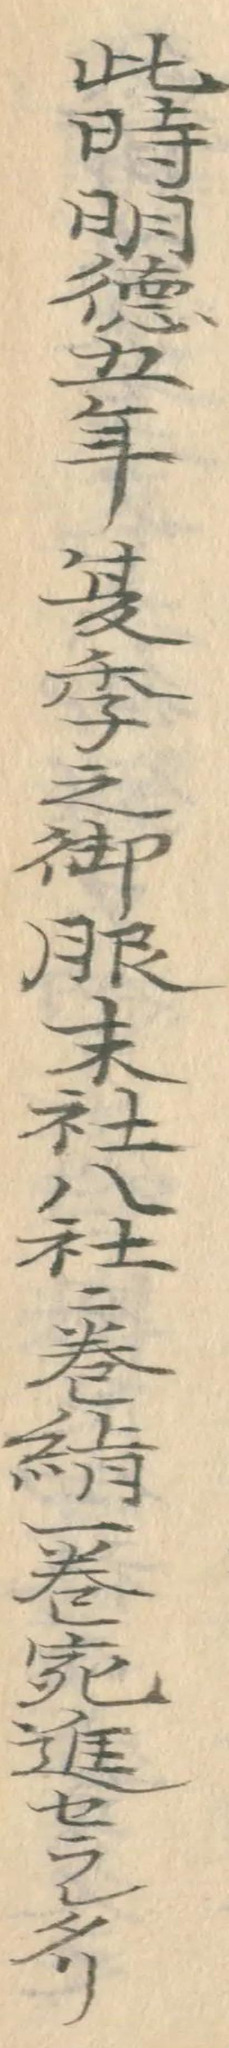此時明徳五年夏季之御服末社八社ニ巻絹一巻宛進セラレタリ

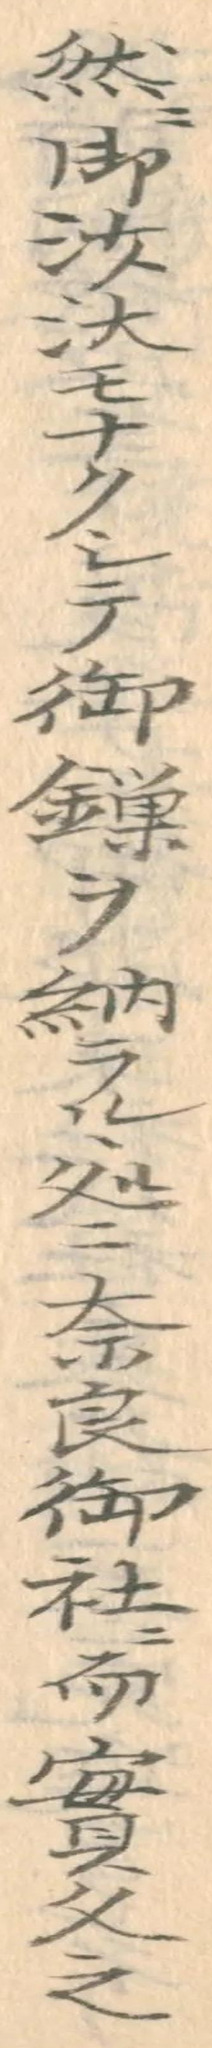然ニ御沙汰モナクシテ御鏁ヲ納ラルヽ処ニ奈良御社ニ而實久之
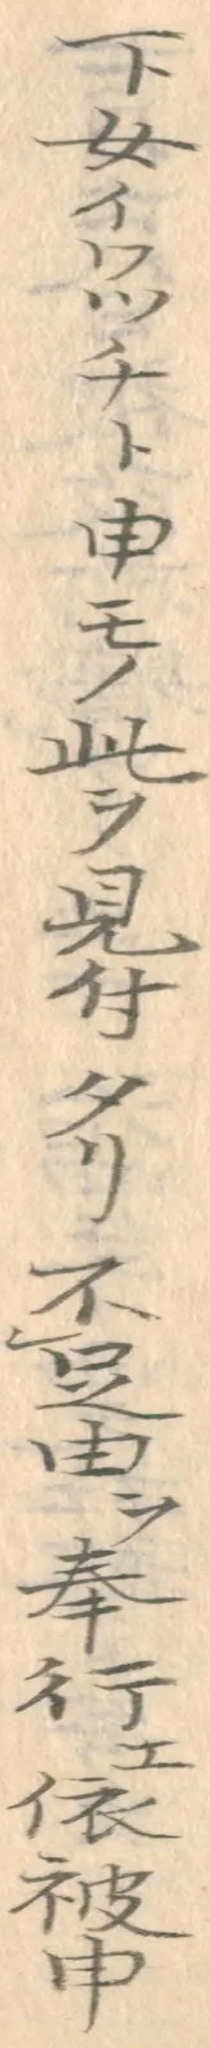下女イワツチト申モノ此ヲ見付タリ不足由ヲ奉行エ依被申
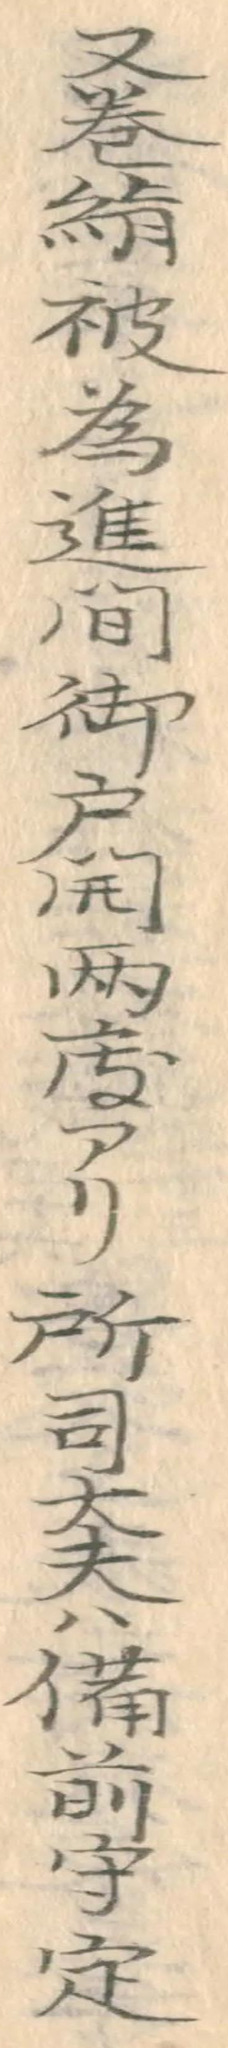又巻絹被為進間御戸開両度アリ所司大夫ハ備前守定
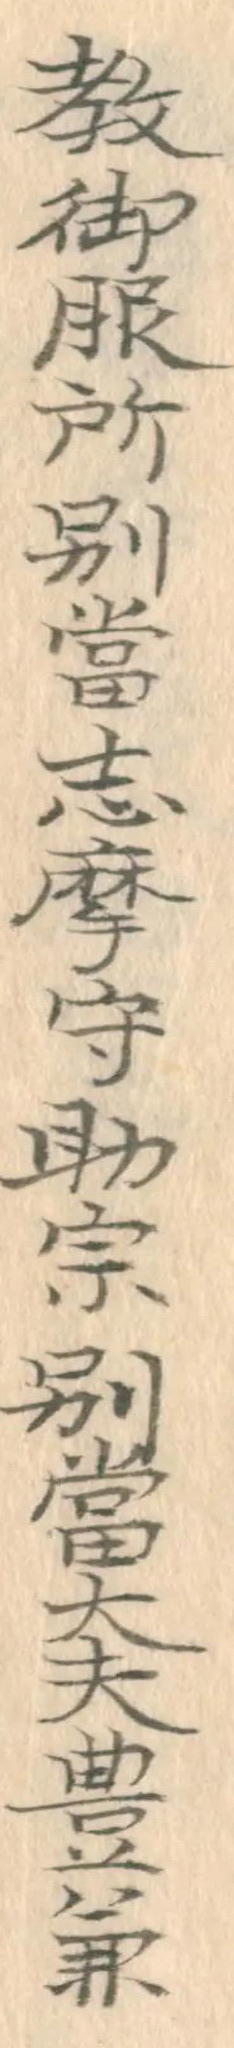教御服所別当志摩守助宗別当大夫豊兼
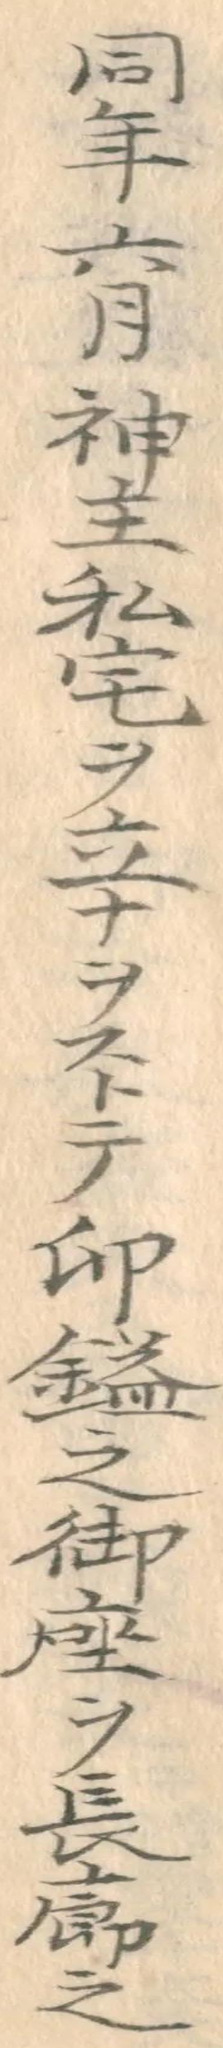同年六月神主私宅ヲ立ナヲストテ印鎰之御座ヲ長廊之
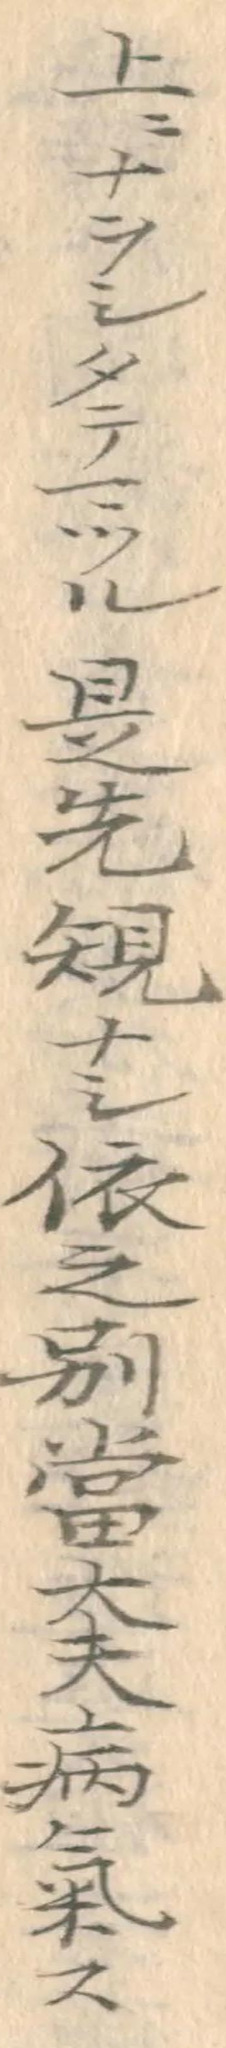上ニナラシタテマツル是先規ナシ依之別当大夫病気ス
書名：賀茂社記録. 第24冊
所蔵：国立国会図書館 National Diet Library, JAPAN
